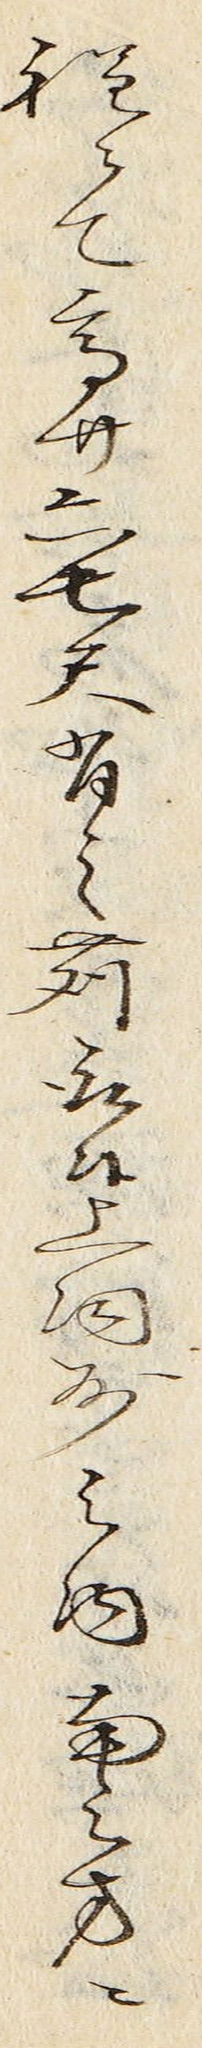程にて高サ六七尺有之刈取候上同州之内南之方に
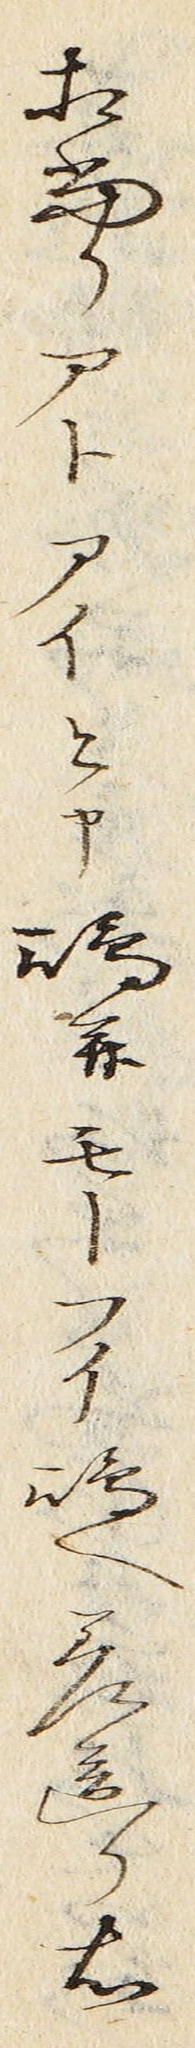相当りアトアイと申嶋并モーフイ嶋へ差送り右
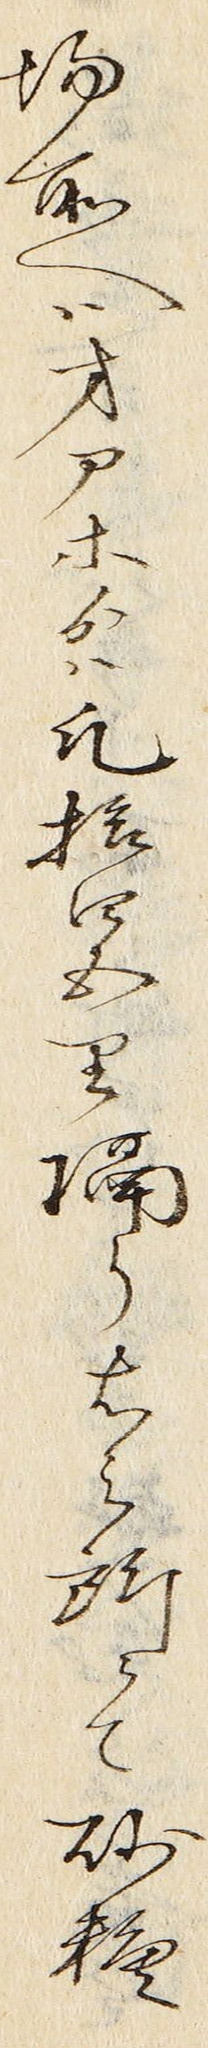場所へはオアホゟは凡拾四五里隔り右之所にて砂糖
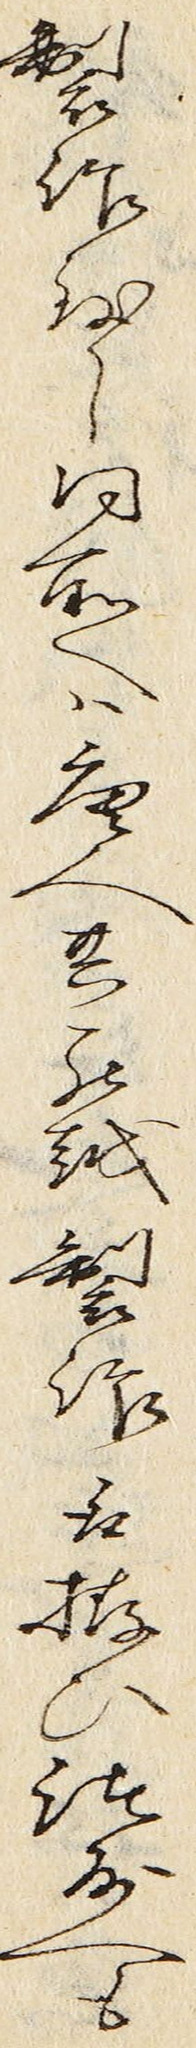製作致し同所へは唐人共罷越製作取拵ひ諸州へも
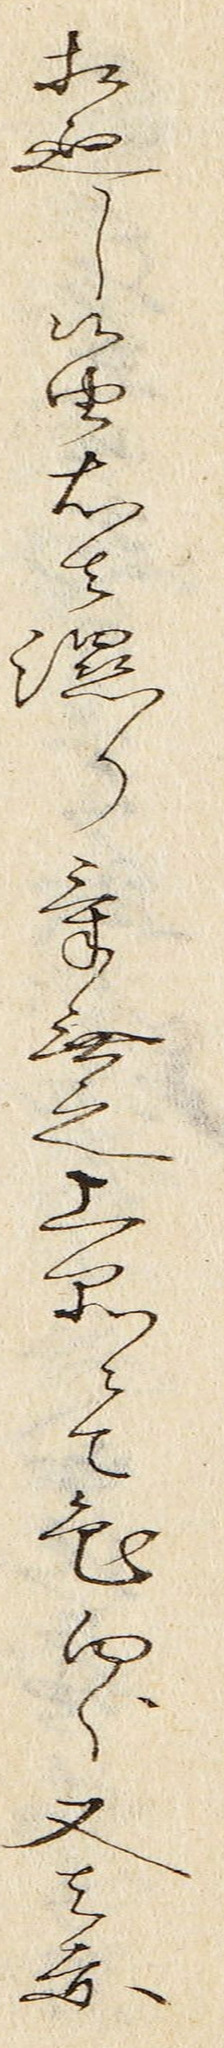相廻し候由右は湿り気無之上品にて色白く又は赤
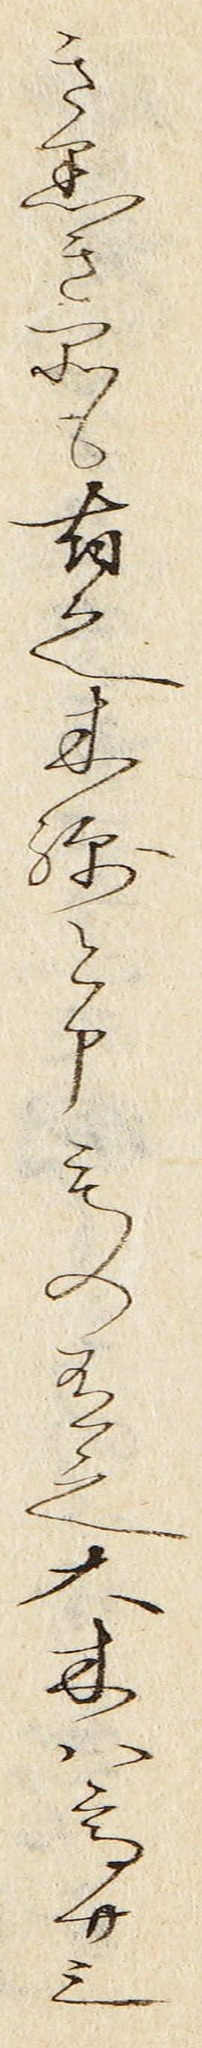き黒き品も有之木綿と申もの有之大木は高さ三
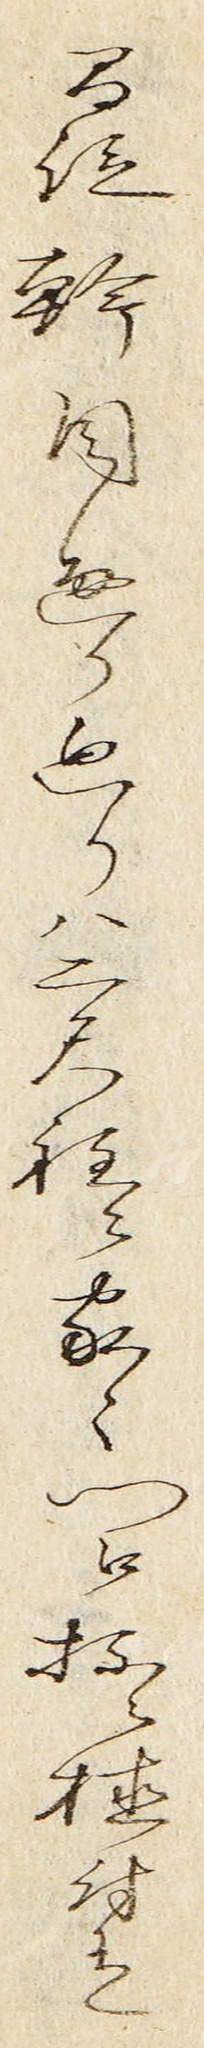間位幹目通り廻りは二尺程に家々門口抔に植付有
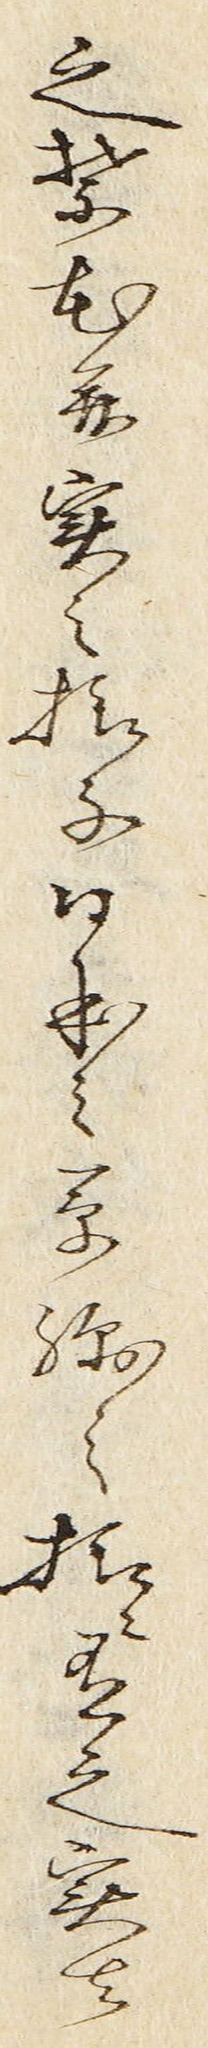之葉花并実之様子日本之草綿之様に有之実は
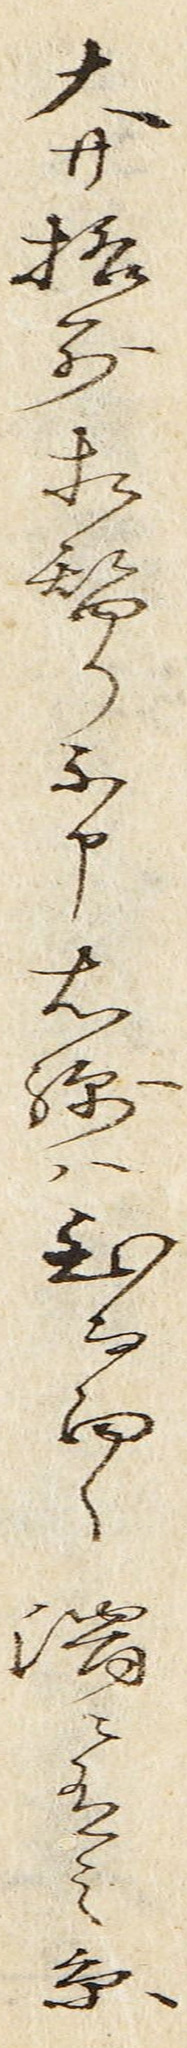大サ格別相替り不申右綿は至而白く滑に有之糸
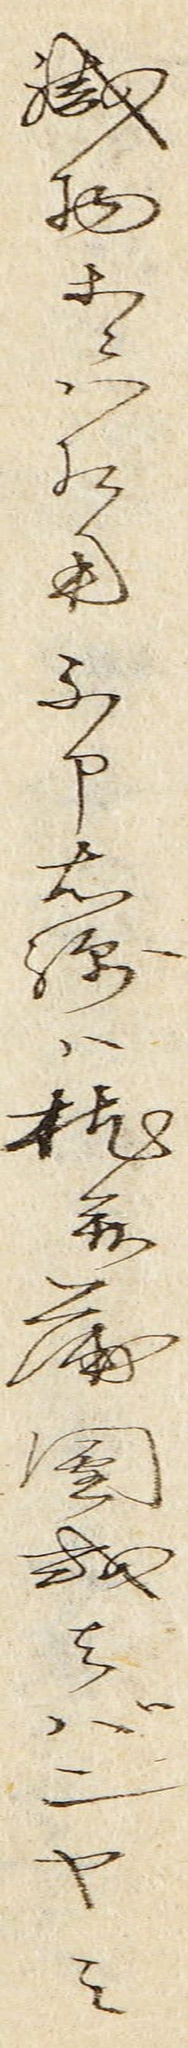織物等には相用不申右綿は枕并蒲団或はバンヤ之
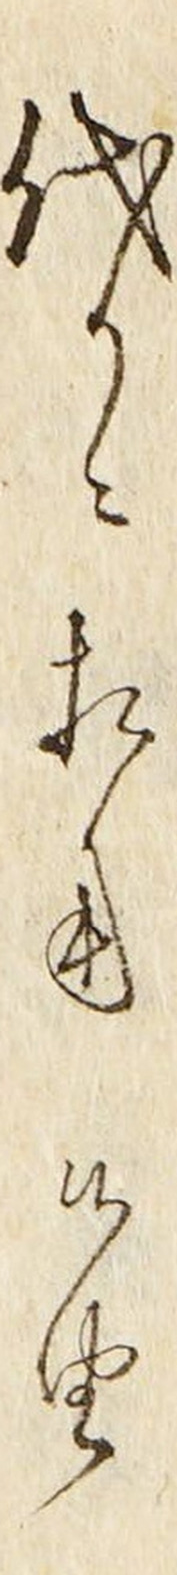代りに相用候由
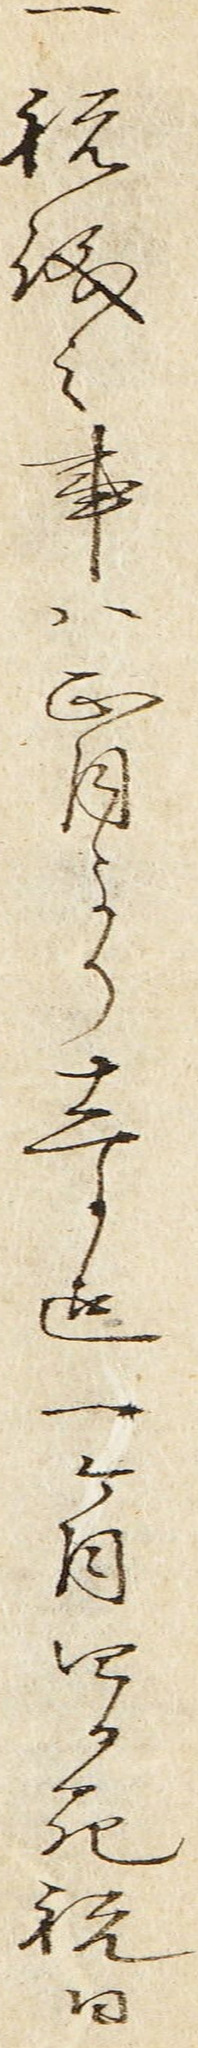一祝儀之事は正月より十二月迄一ヶ月四日宛祝日
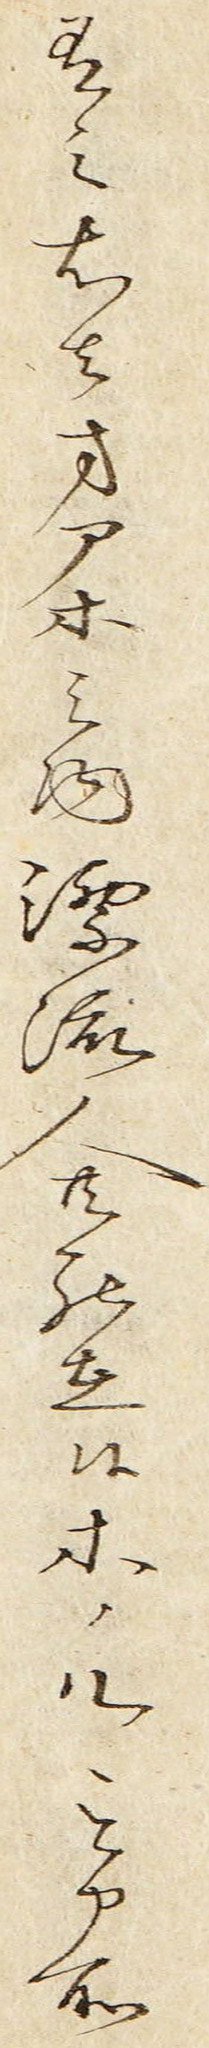有之右はオアホ之内漂流人共罷在候ホノルヽと申所

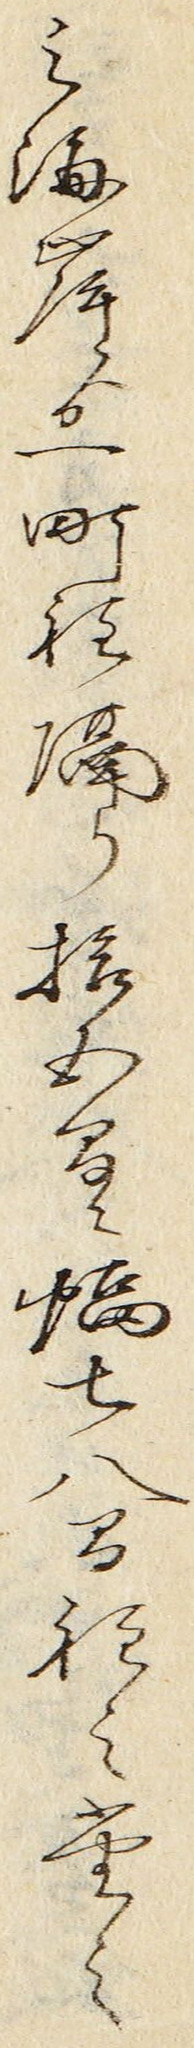之海岸ゟ一町程隔り拾五間に幅七八間程之堂之
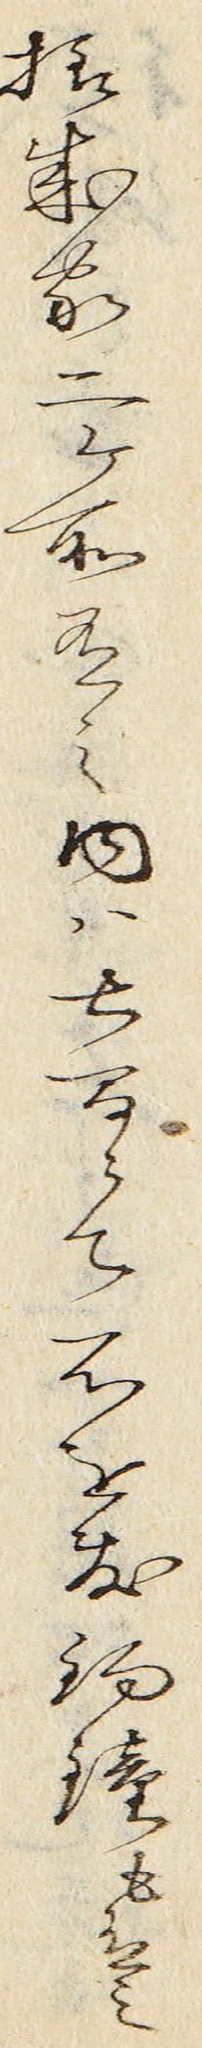様成家二ヶ所有之内は土間にて石を敷釣鐘も有之
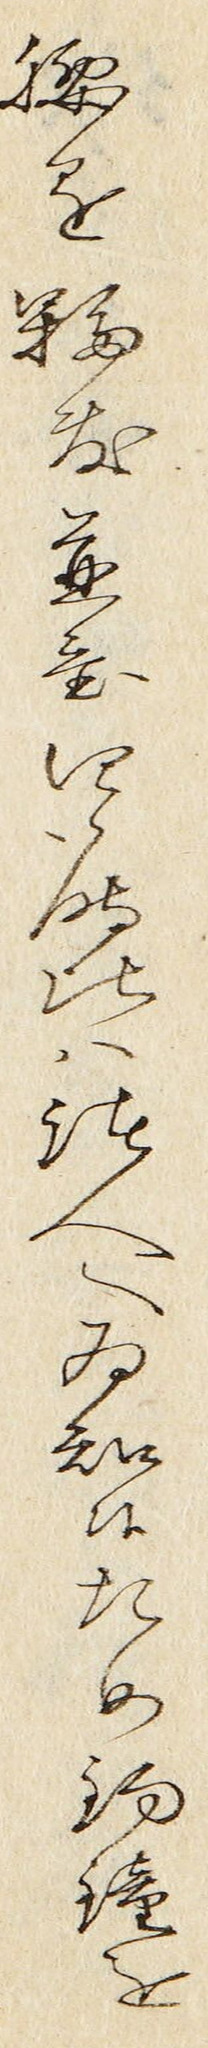腰懸夥敷並置四ッ時比は諸人へ為知候ため釣鐘を
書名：土佐中浜万次郎漂流記
